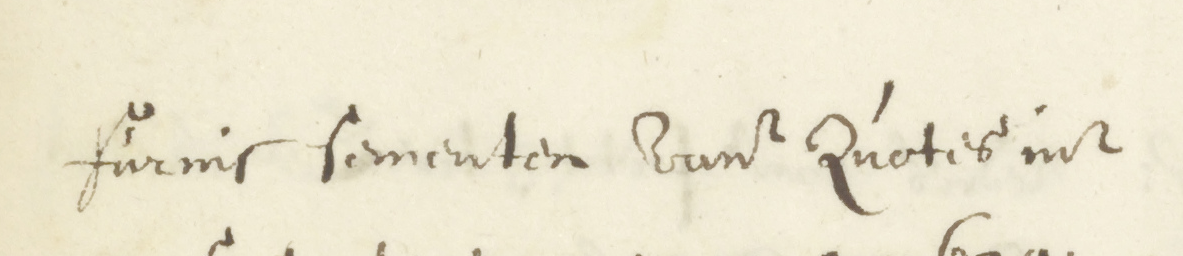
furnissementen van Quotes in
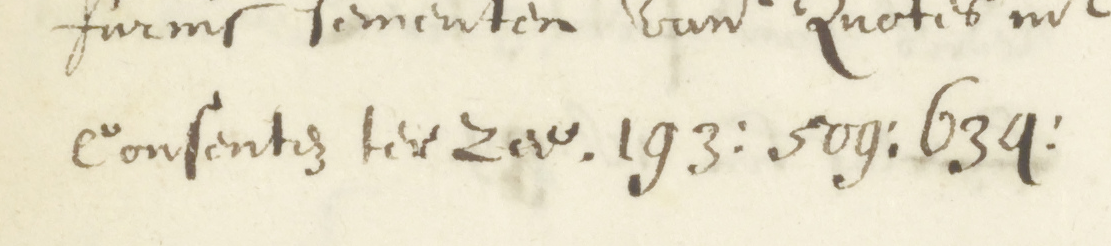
Consenten ter zee. 193: 509: 634:
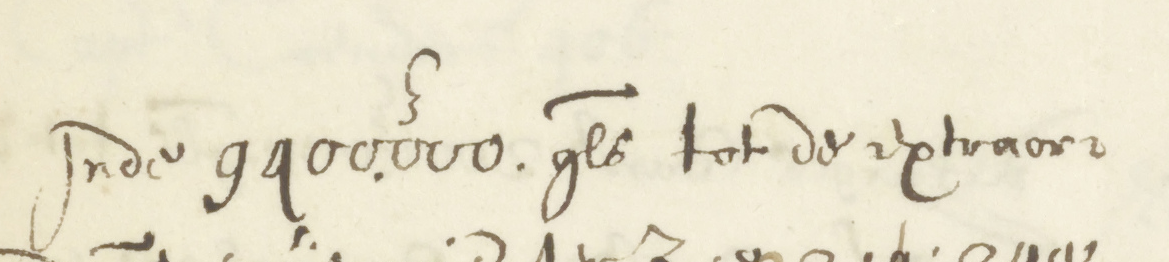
Inde 9400.000. gls tot de extraor„
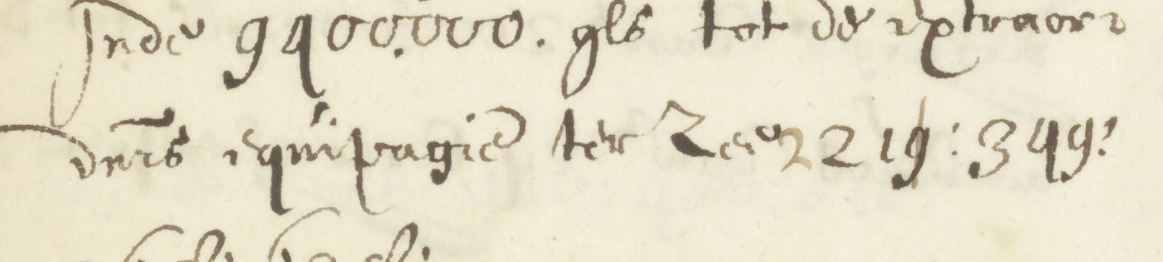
dnrs equipagie ter Zee 219: 349:
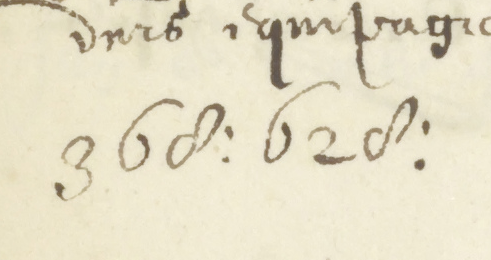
368: 628:
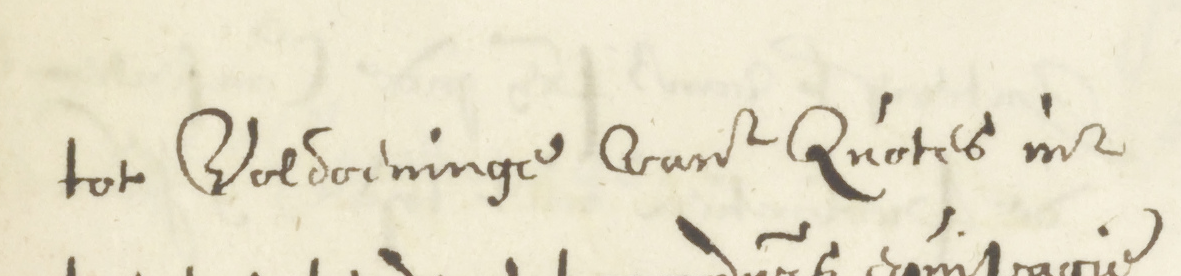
tot Voldoeninge van Quotes in
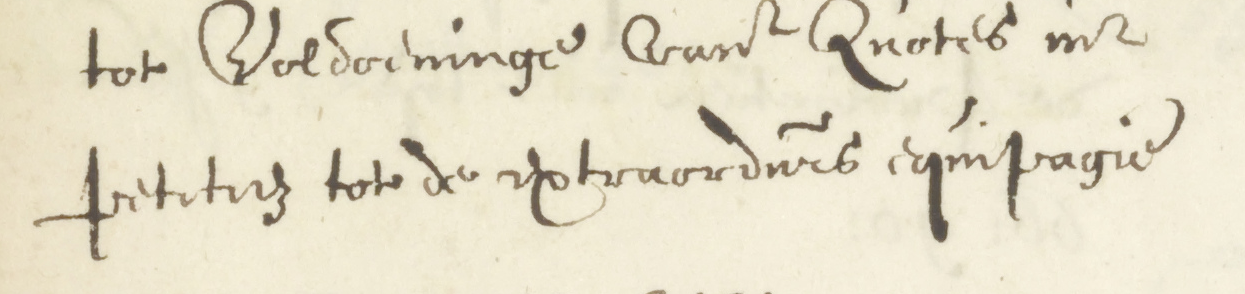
petitien tot de extraordnrs equipagie
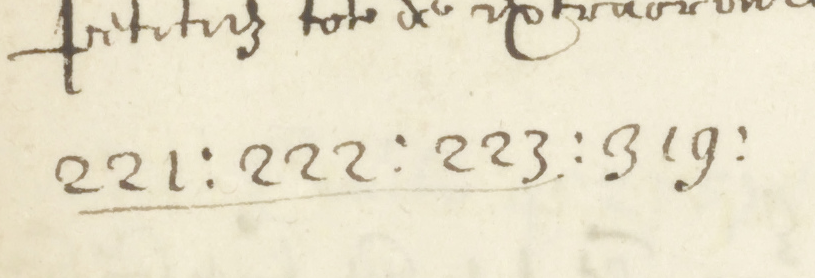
221: 222: 223: 319:
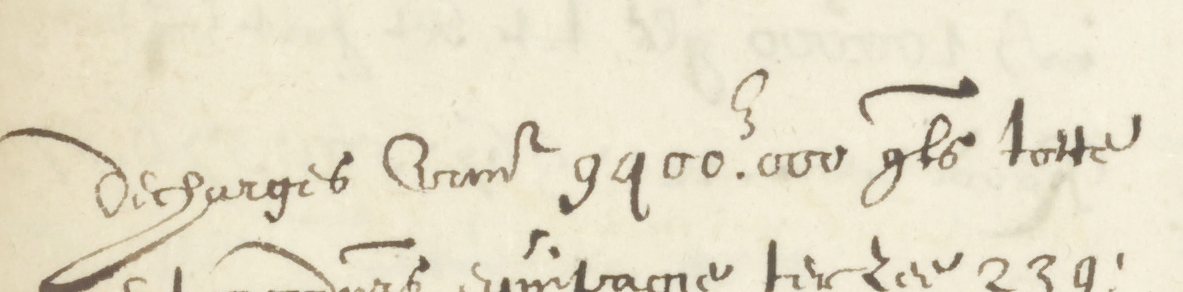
decharges van 9400.000 gls totte
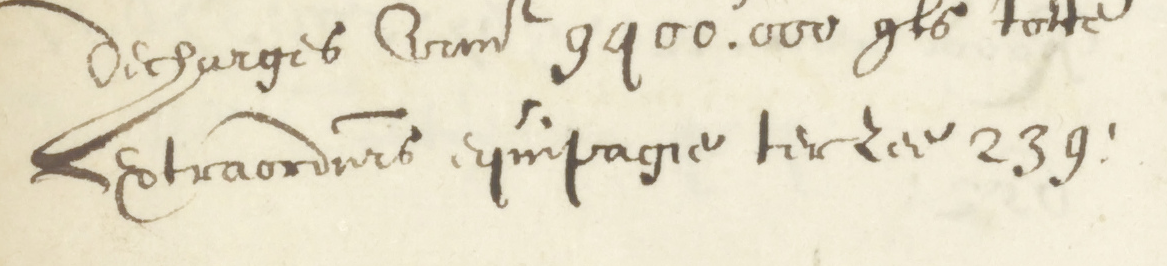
extraordnrs equipagie ter Zee 239:
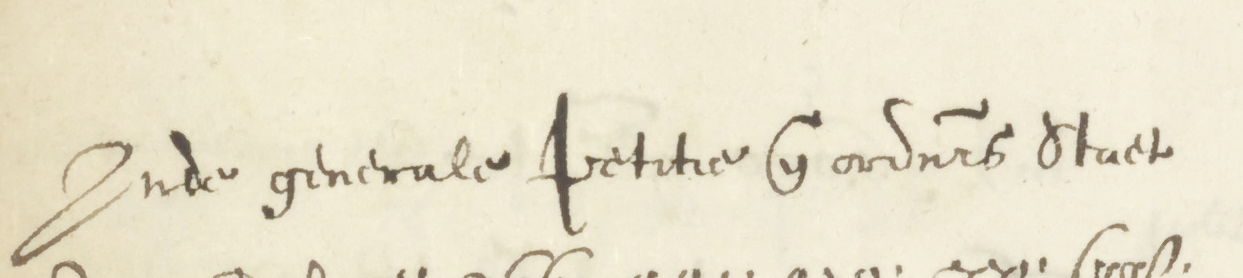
Inde generale Petitie & ordnrs Staet
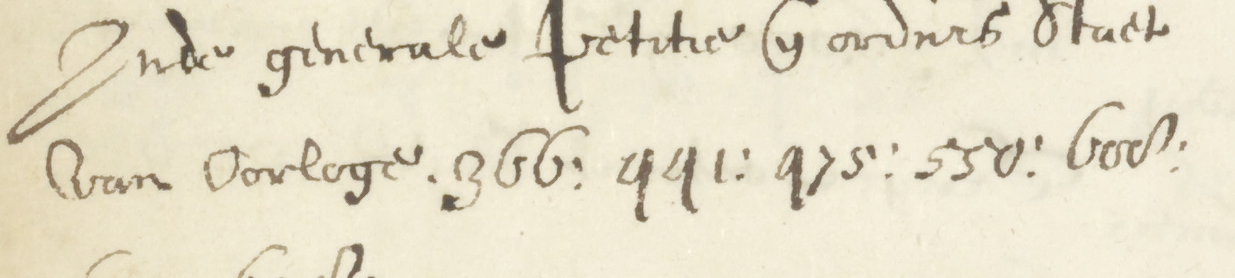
van Oorloge. 366: 441: 475: 550: 608:
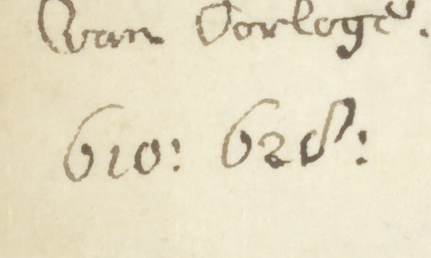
610: 628:
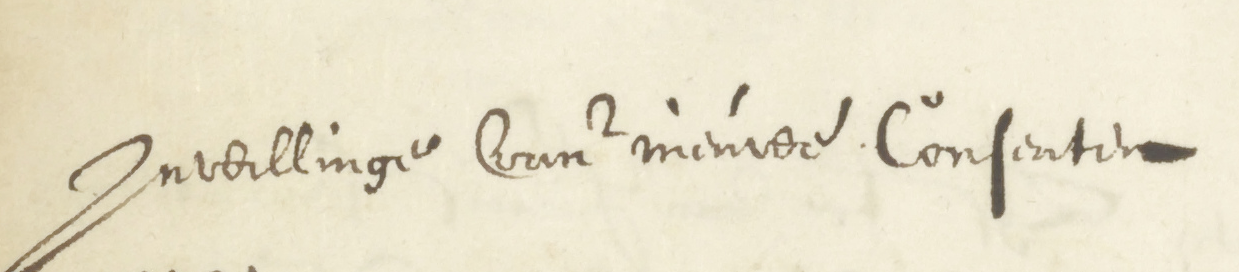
Inwillinge van nieuwe Consenten
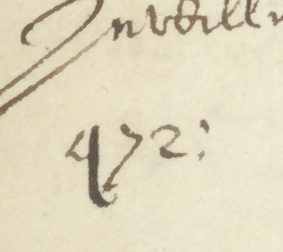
472:
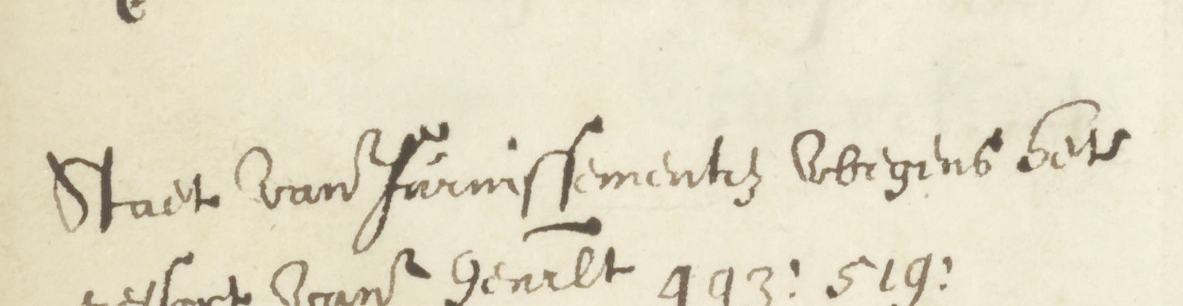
Staet van furnissementen wegens het
